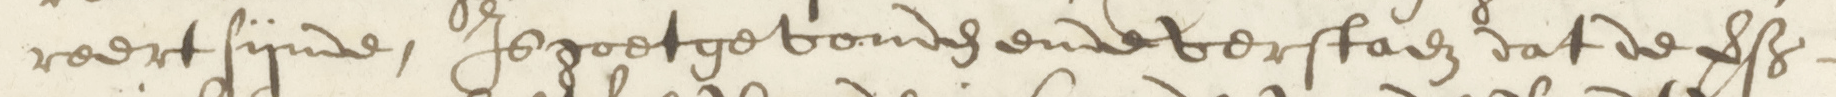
reert sijnde, Is goetgevonden ende verstaen dat de vs
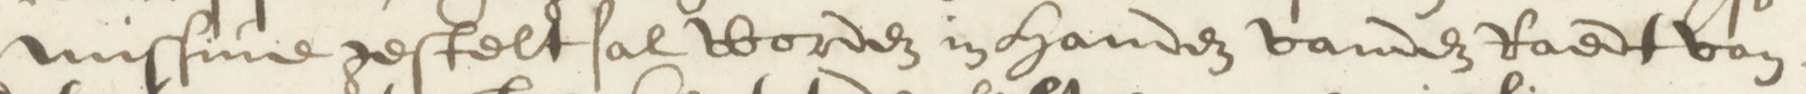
missiue gestelt sal worden in handen vanden Raedt van
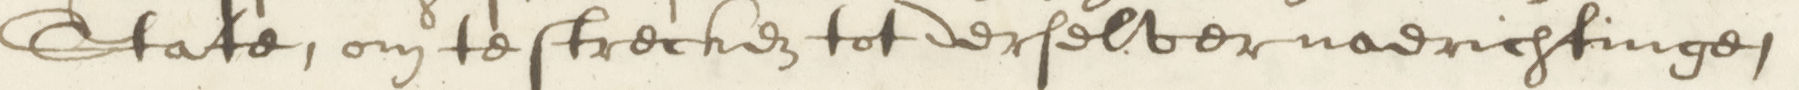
State, om te strecken tot derselver naerichtinge.
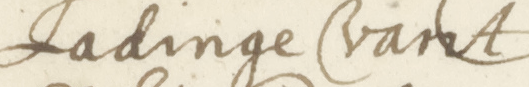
Ladinge vant
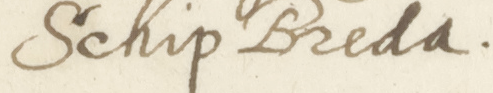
Schip Breda
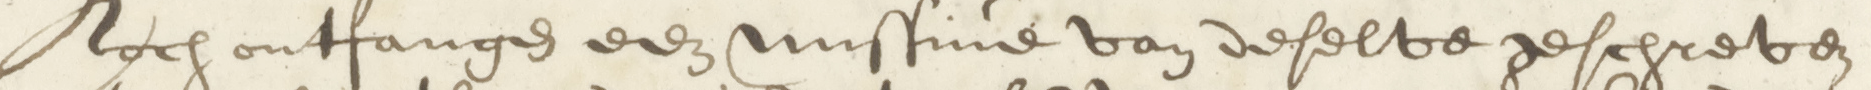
Noch ontfangen een missiue van deselve geschreven
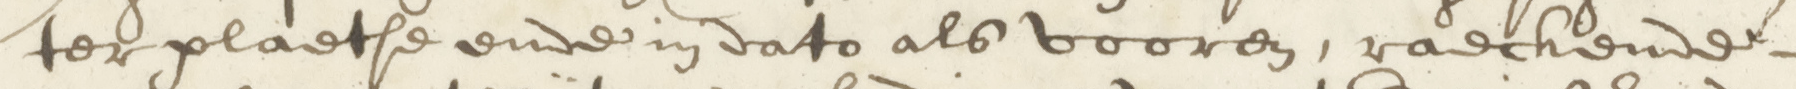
ter plaetse ende in dato als vooren, raeckende
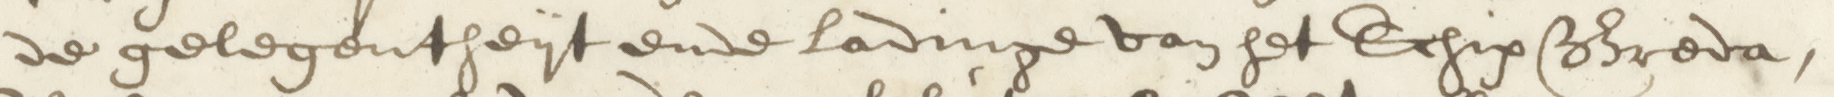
de gelegentheijt ende ladinge van het Schip Breda,
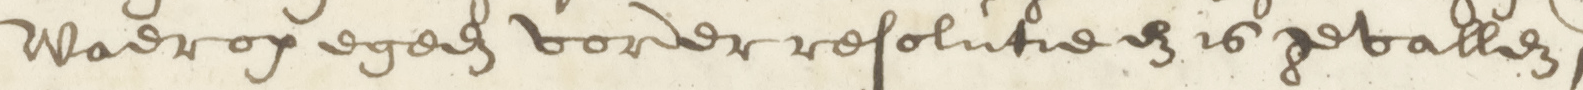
Waerop egeen vorder resolutie en is gevallen
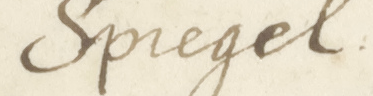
Spiegel.
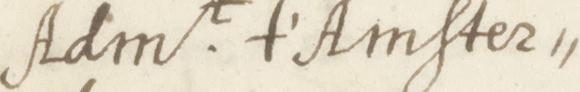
Admt. t' Amster„
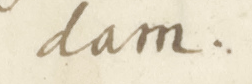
dam.
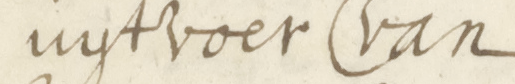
uijtvoer van
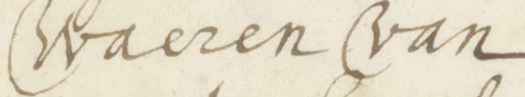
Waeren van
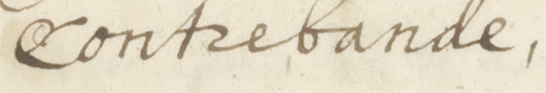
Contrebande,
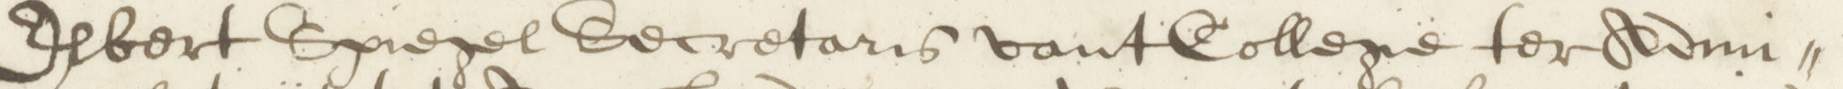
Elbert Spiegel Secretaris vant Collegie ter Admi„
